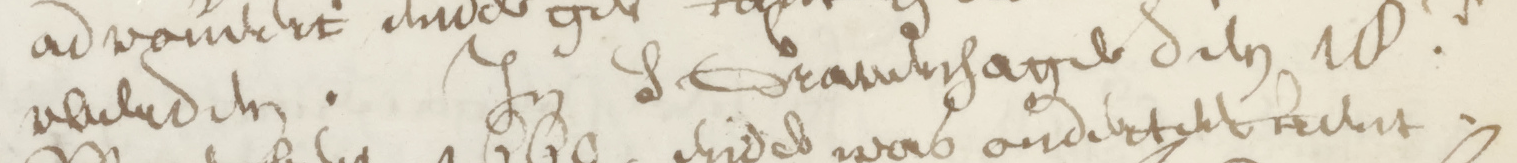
werden. In 's Gravenhage den 18e.
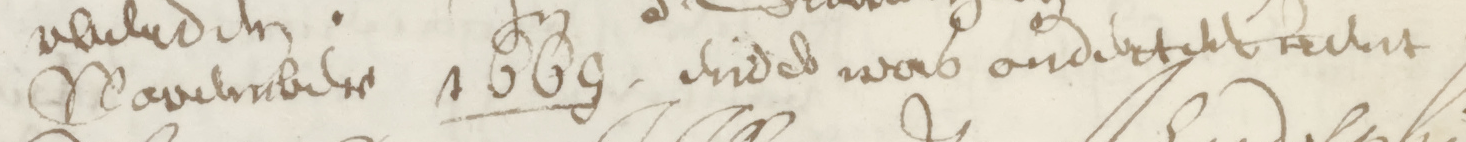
November 1669 ende was onderteeckent
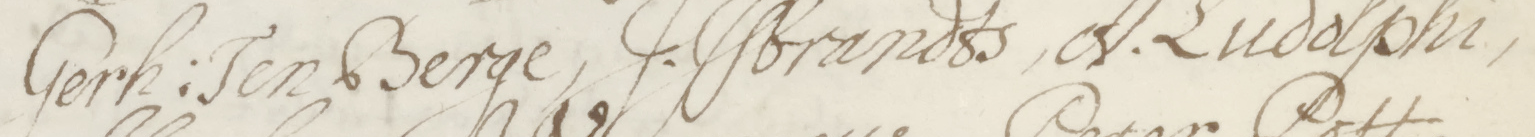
Gerh: Ten Berge, I. Isbrandts, A. Ludolphi,
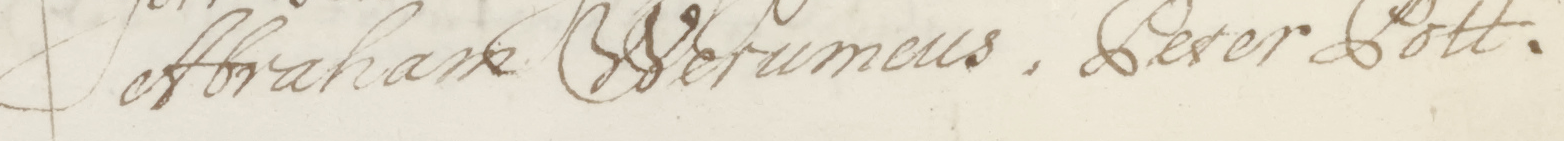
Abraham Werumeus, Peter Pott.
